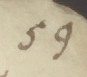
59
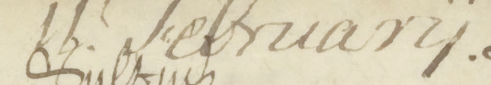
11. Februarij.
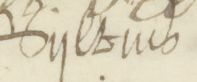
Sylvius
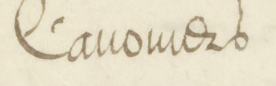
Canoniers
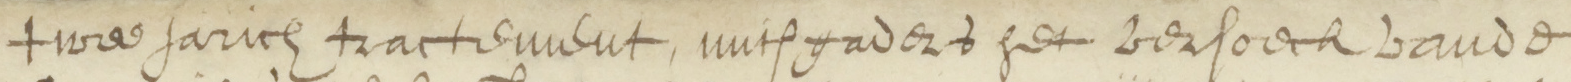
twee jarich tractement, mitsgaders het versoeck vande
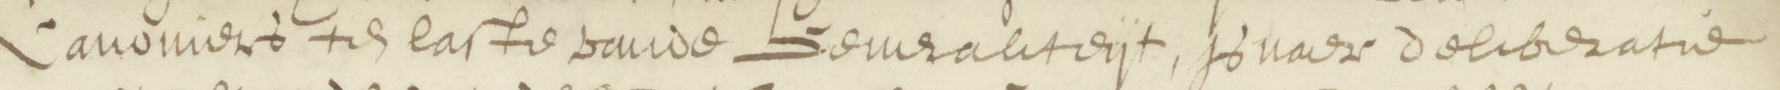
Canoniers ten laste vande Generaliteijt, is naer deliberatie
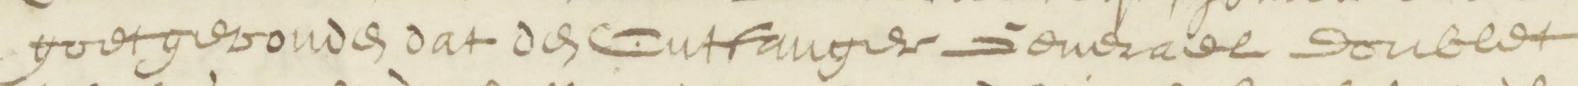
goetgevonden dat den Ontfanger Generael Doublet
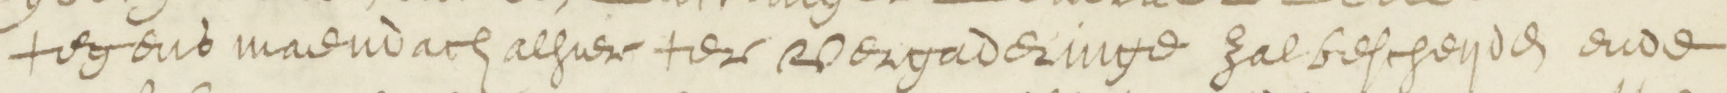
tegens maendach alhier ter Vergaderinge zal bescheyden ende
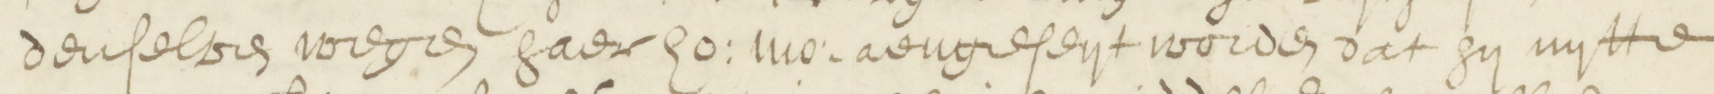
denselven wegen haer ho:mo: aengeseyt worden dat hy uytte
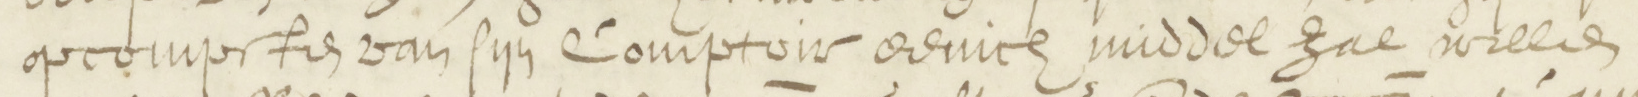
opcompsten van syn Comptoir eenich middel zal willen
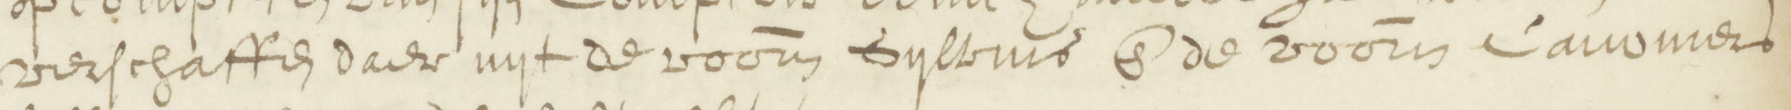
verschaffen daer uyt de voorn Sylvius & de voorn Canoniers
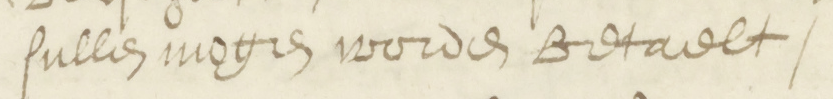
sullen mogen worden betaelt.
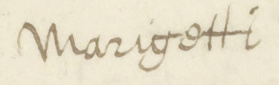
Marigetti
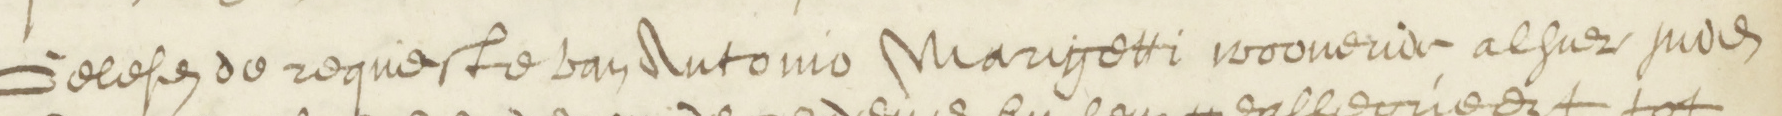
Gelesen de requeste van Antonio Marigetti woonende alhier inden
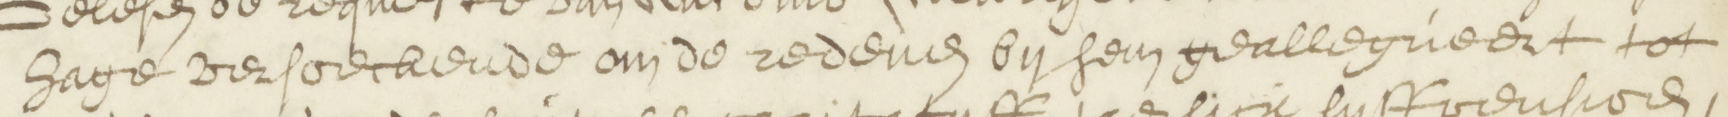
hage versoeckende om de redenen by hem geallegueert tot
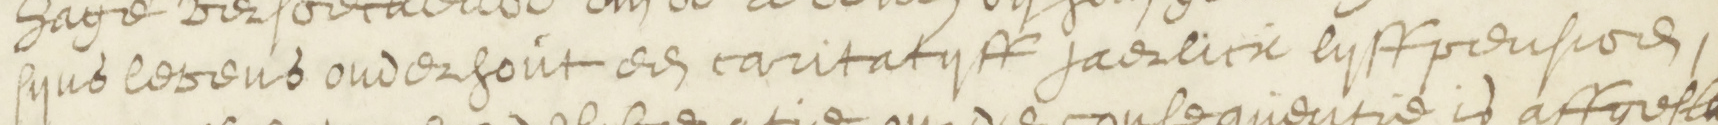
syns levens onderhout een caritatyff jaerlicx lyffpensioen,
